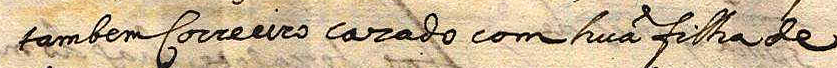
tambem Correeiro cazado com huā filha de
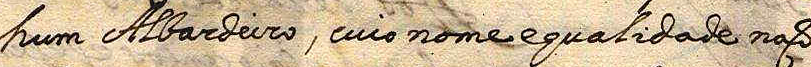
hum Albardeiro, cuio nome e qualidade naõ
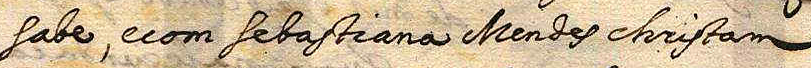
sabe, e com sebastiana Mendes christam
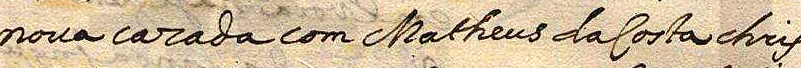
noua cazada com Matheus da Costa chris
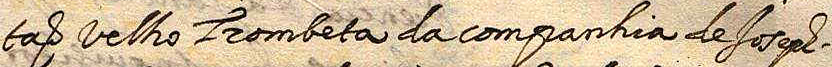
taõ velho Trombeta da companhia de Joseph
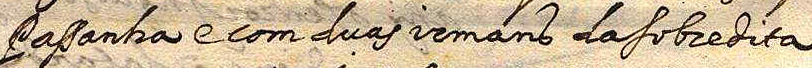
Passanha e com duas irmans da sobredita
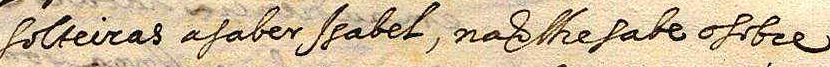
solteiras a saber Jsabel, naõ lhe sabe o sobre
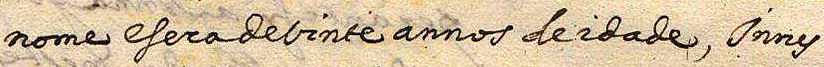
nome e sera de vinte annos de idade, Jnnes
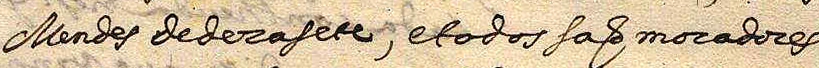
Mendes de dezasete, e todos saõ moradores
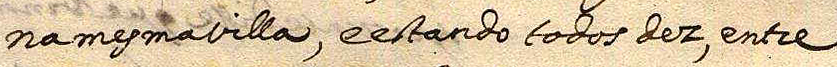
na mesma villa, e estando todos dez, entre
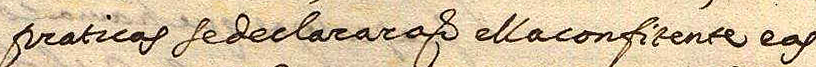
praticas se declararaõ ella confitente e as
